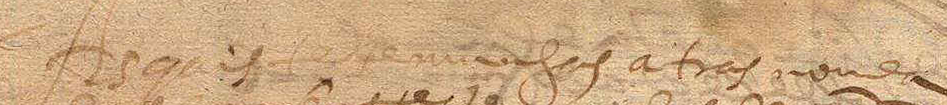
As qais testemunhas atras nomea
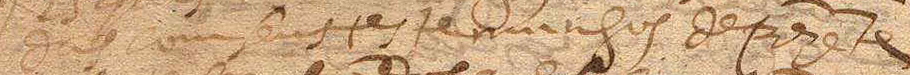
das com seus testemunhos de presēte
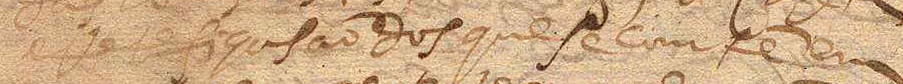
e Retefiqasaõ dos que se comtē em
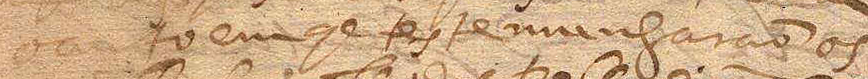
o auto em qe testemunharaõ os
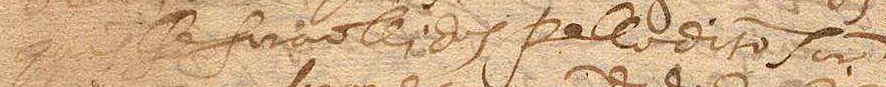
qais lhe foraõ llidos pello dit̄o sor̄
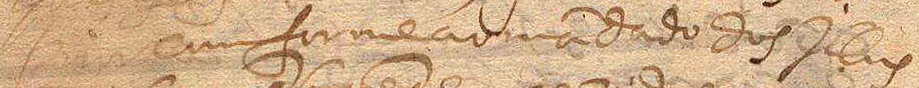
prir comforme ao mādado dos Jllus
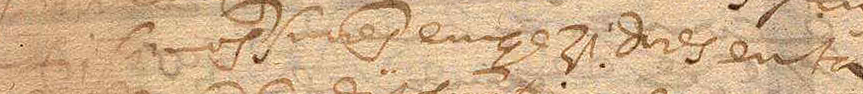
trisimos Sorēs emqezidores eu ta
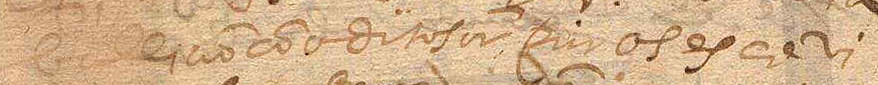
balliaõ cō o dito sor̄ prir os escrevi
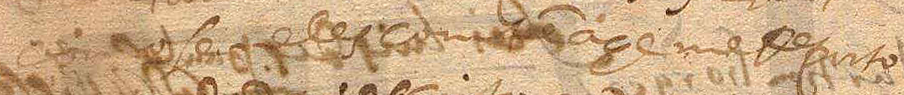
como se nelles comtē a qe me Reporto
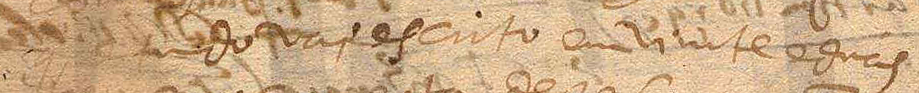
que tudo vaj escrito em vimte e duas
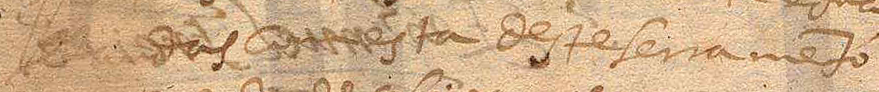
llaudas com esta deste serramēto
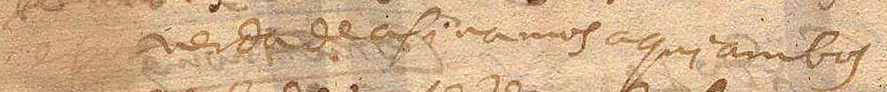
e por verdade asinamos aquj ambos
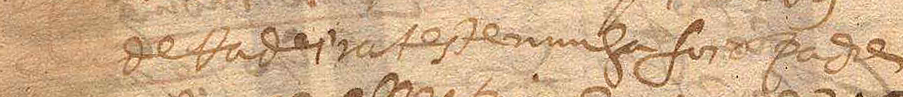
deRadeira testemunha foi o padre
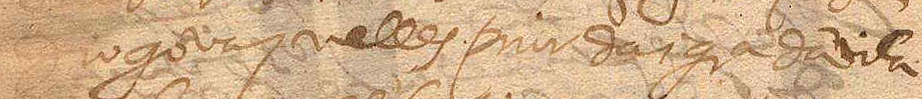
diogo vaz velles prior da igra da vila
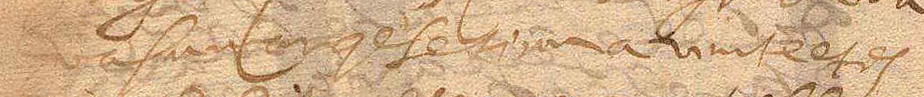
do asumar qe se tirou a vimte e tres
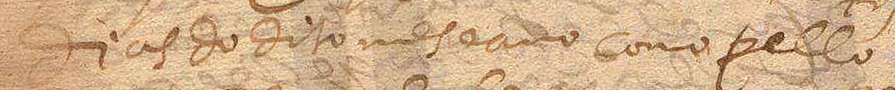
dias do dito mes e ano como pello
